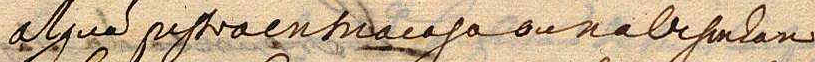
alguā pessoa en sua casa ou na visinhan
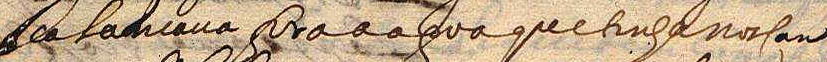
ca lancaua fora a agoa que tinha nos Can
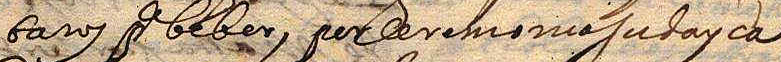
taros pa beber, por ceremonia Judayca
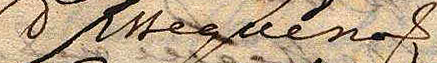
Disse que naõ
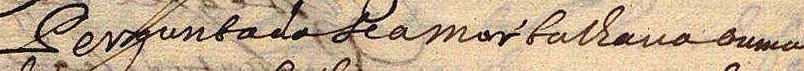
Perguntada se amortalhaua ou mā
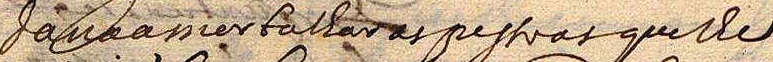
daua amortalhar as pessoas que lhe
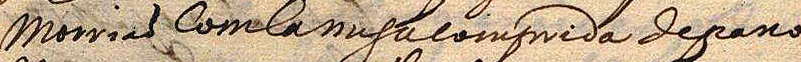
morriaõ com Camisa comprida de pano
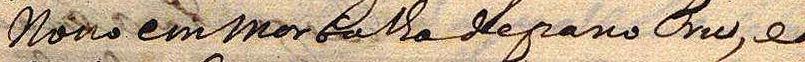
Nouo em mortalha de pano cru, e
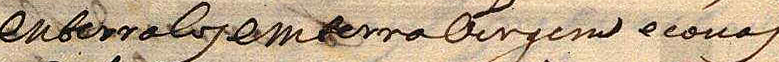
enterralos em terra virgem e couas
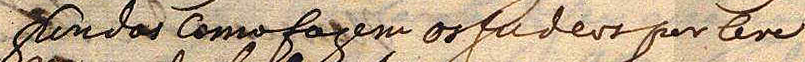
fundas como fazem os Judeos por cere
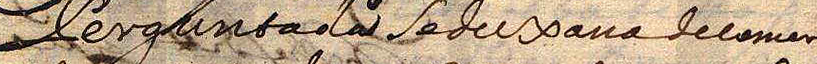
Perguntada Se deixaua de comer
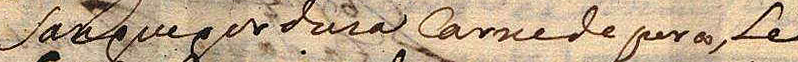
Sangue gordura carne de porco, Le
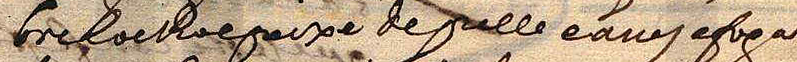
bre Coelho e peixe de pelle e aues afoga
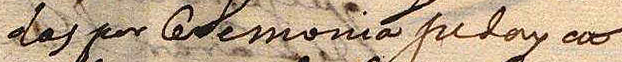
das por ceremonia Judayca
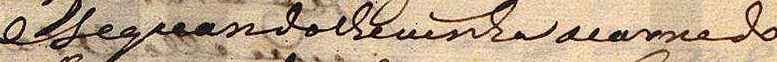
e se quando lhe uinha a carne do
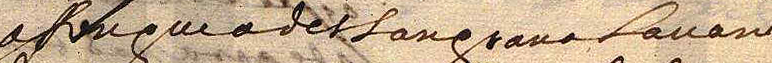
assougue a dessangraua Lauan
